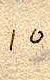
10
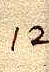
12
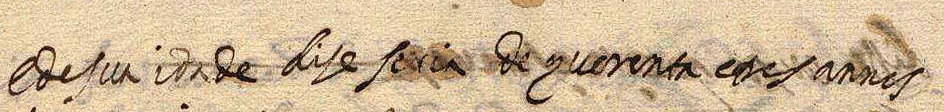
e de sua idade dise seria de quarenta e tres annos
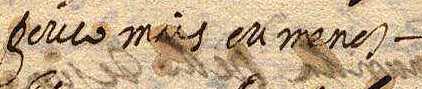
pouco mais ou menos
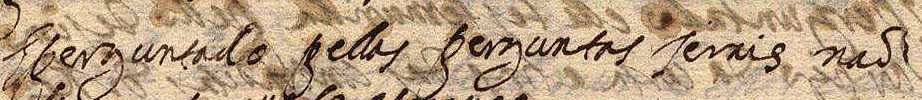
E perguntado pellas perguntas jerais naõ
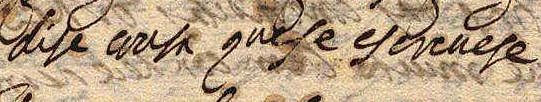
dise cousa que se escreuese
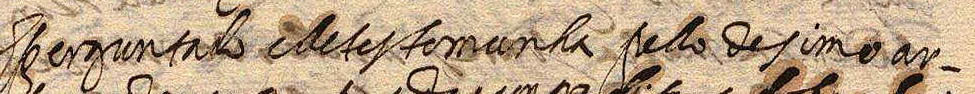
E perguntado elle testemunha pello desimo ar
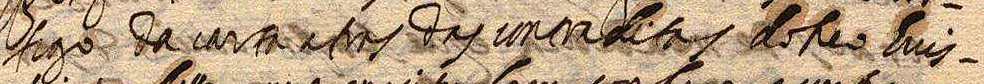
tigo da carta atras das contraditas do Reo luis
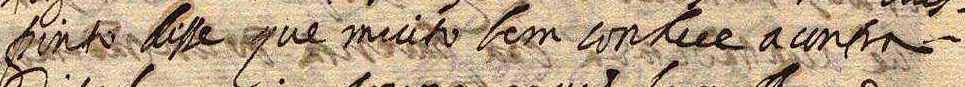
pinto disse que muito bem conhece a contra
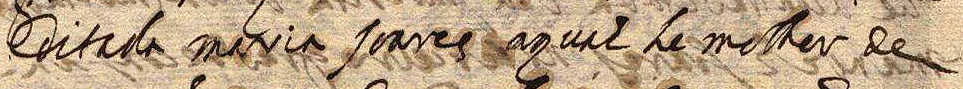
ditada maria soares a qual he molher de
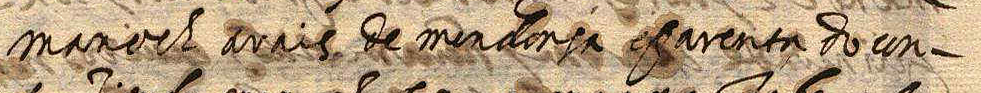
manoel arais de mendonsa e parenta do con
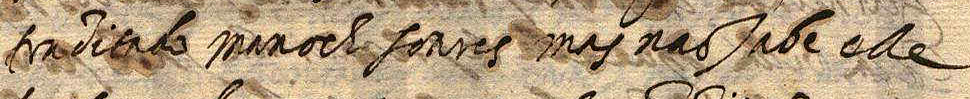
traditado manoel soares mas naõ sabe elle
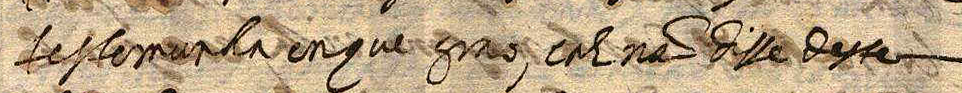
testemunha en que grao, e al naõ disse deste
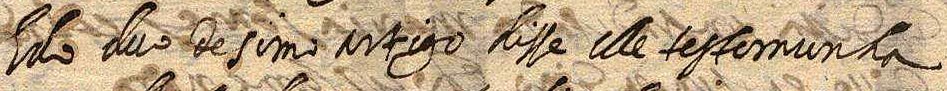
E do dito desimo artigo disse elle testemunha
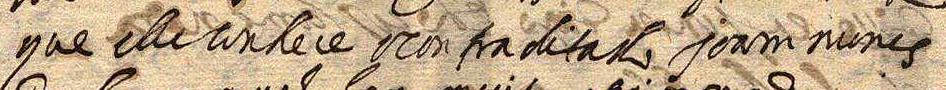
que elle conhece o contraditado joam nunes
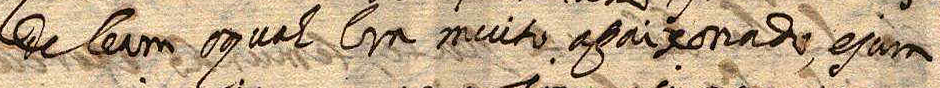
de leam o qual Era muito apaixonado, e jura
